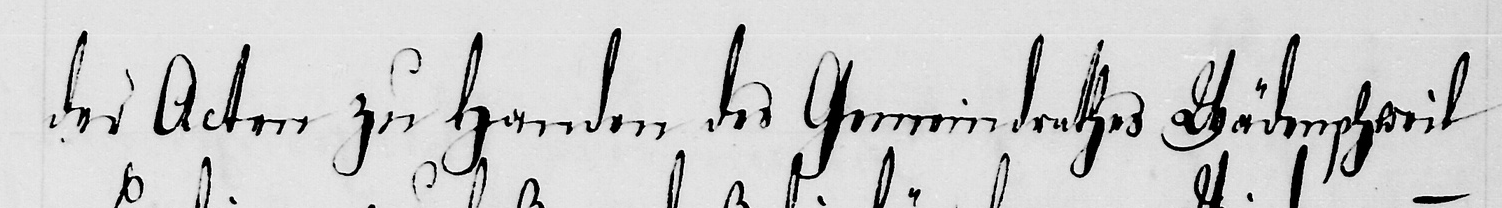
der Acten zu Handen des Gemeindrathes Wädenschweil
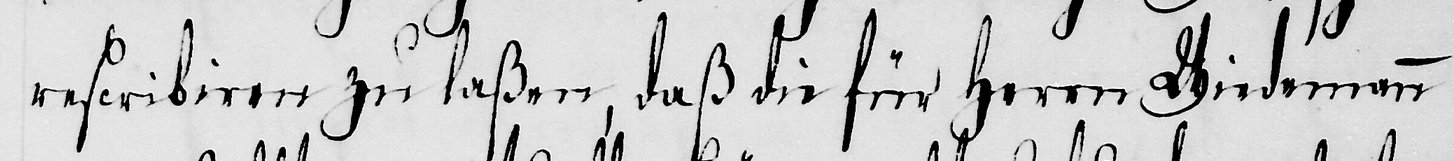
rescribiren zu laßen, daß die für Herrn Wiedemann
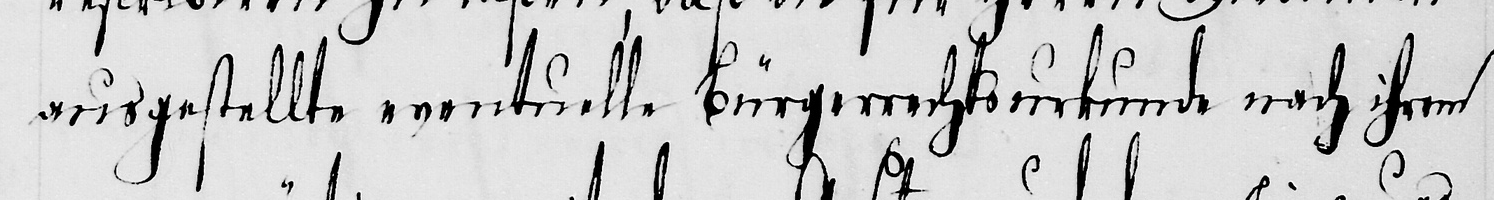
ausgestellte eventuelle Bürgerrechtsurkunde nach ihrem
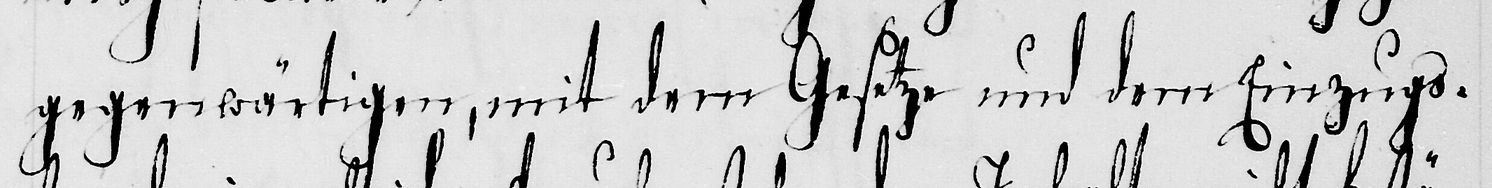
gegenwärtigen, mit dem Gesetze und dem Einzugs¬
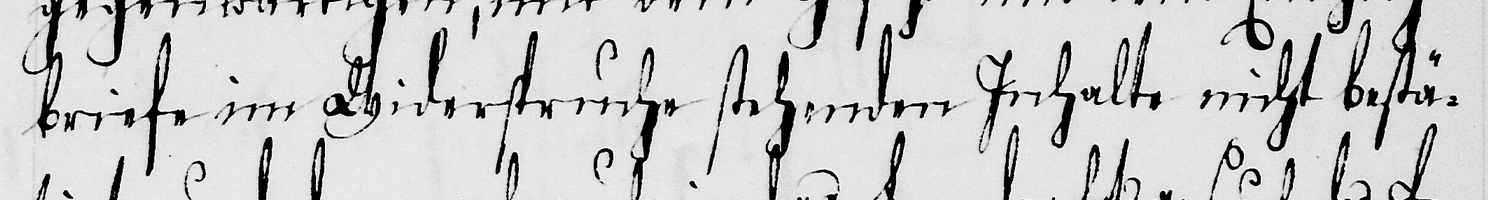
briefe im Widerspruche stehenden Inhalte nicht bestä¬
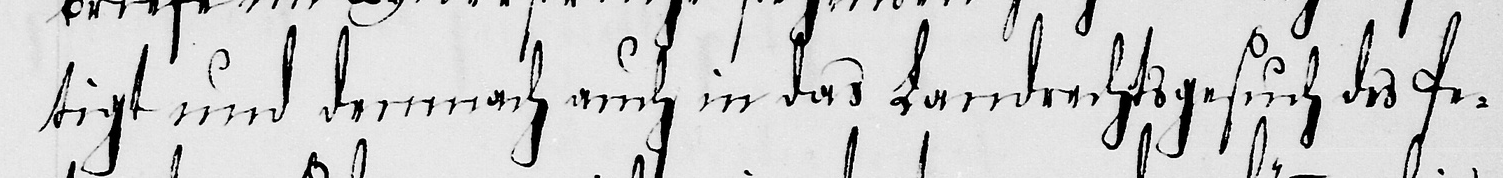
tigt und demnach auch in das Landrechtsgesuch des Pe¬
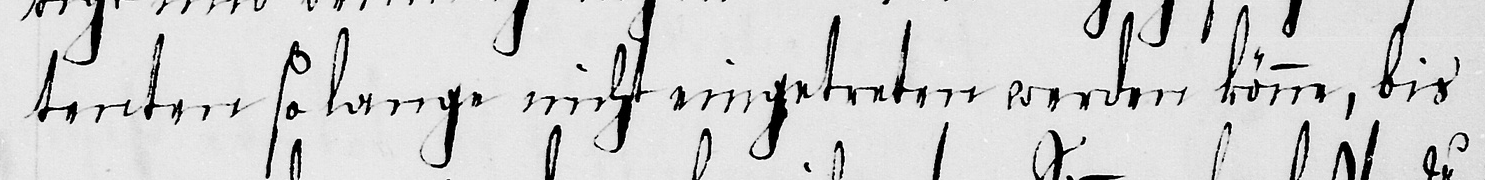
tenten so lange nicht eingetreten werden könne, bis
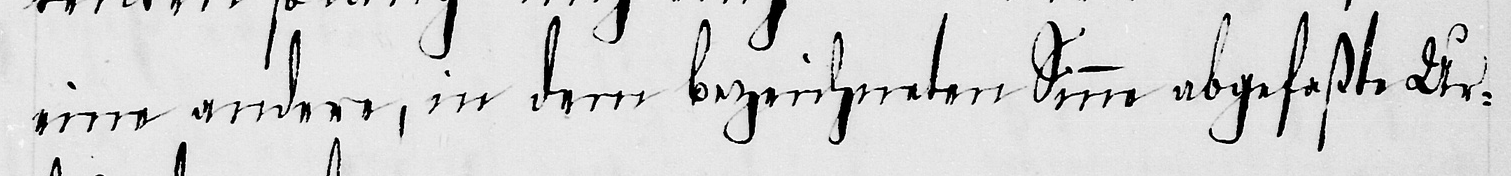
eine andere, in dem bezeichneten Sinne abgefaßte Ur¬
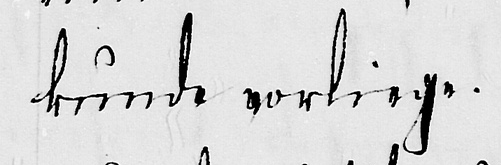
kunde vorliege.
